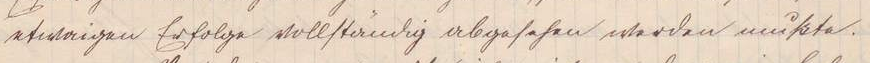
etwaigen Erfolge vollständig abgesehen werden mußte.
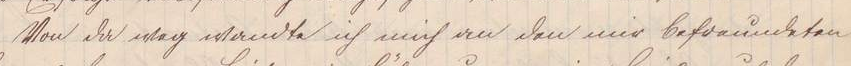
Von da weg wandte ich mich an den mir befreundeten
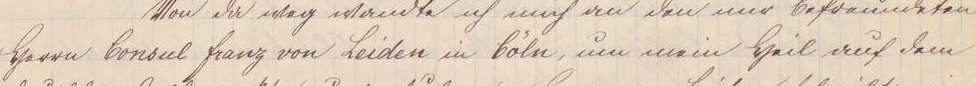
Herrn Consul Franz von Leiden in Cöln, um mein Heil auf dem
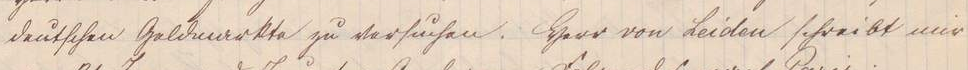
deutschen Geldmarkte zu versuchen. Herr von Leiden schreibt mir
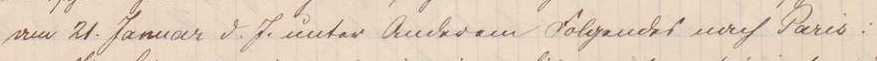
am 21. Januar d. J. unter Anderem Folgendes nachParis:
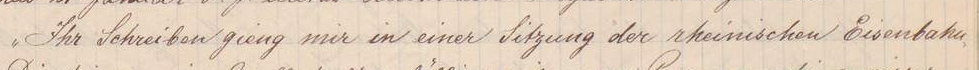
«Ihr Schreiben gieng mir in einer Sitzung der rheinischen Eisenbahn -
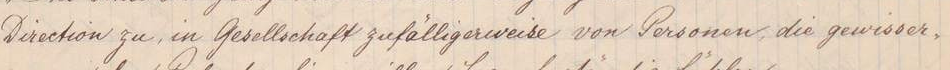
Direktion zu, in Gesellschaft zufälligerweise von Personen, die gewisser-
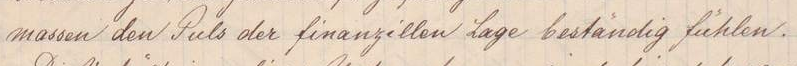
massen den Puls der finanzillen Lage beständig fühlen.
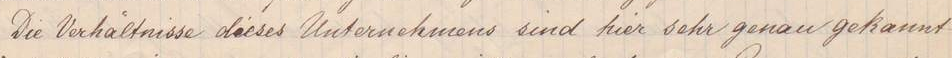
Die Verhältnisse dieses Unternehmens sind hier sehr genau gekannt
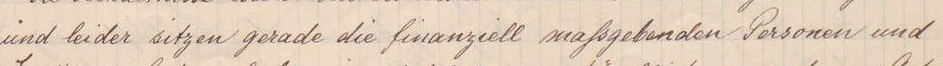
und leider sitzen gerade die finanziell maßgebenden Personen und
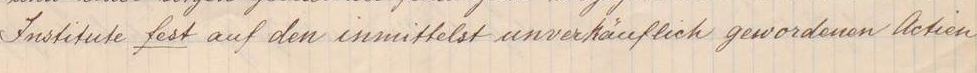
Institute fest auf den inmittelst unverkäuflich gewordenen Actien
